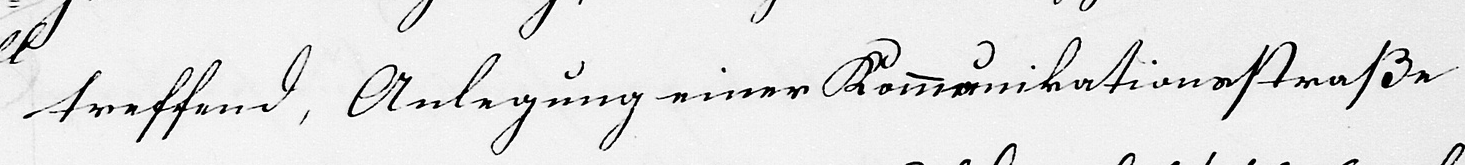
treffend, Anlegung einer Kommunikationsstraße
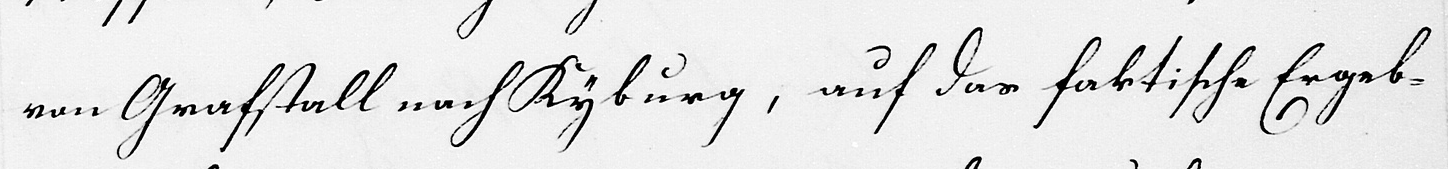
von Grafstall nach Kyburg, auf das faktische Ergeb¬
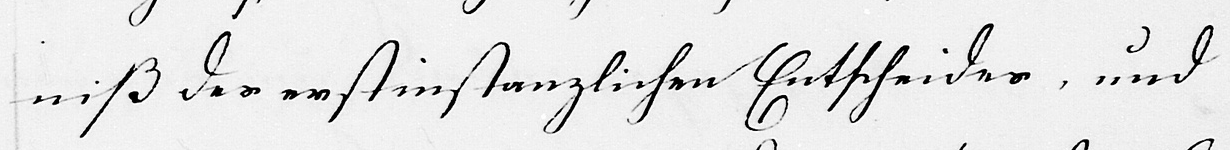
niß des erstinstanzlichen Entscheides, und
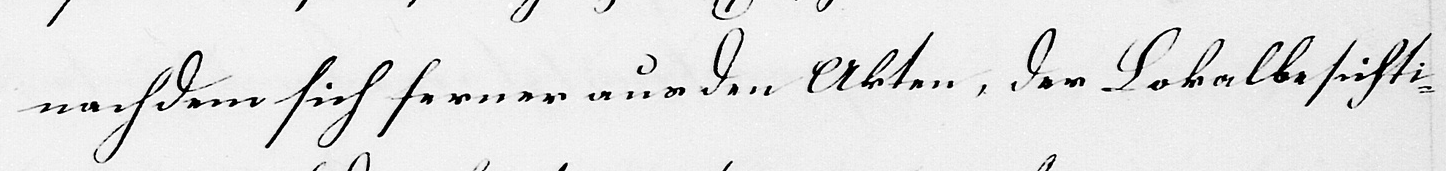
nachdem sich ferner aus den Akten, der Lokalbesichti¬
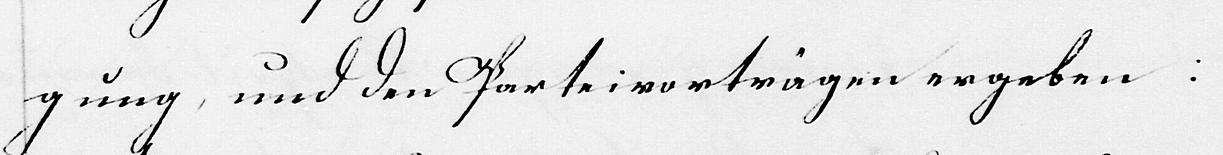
gung, und den Parteivorträgen ergeben:
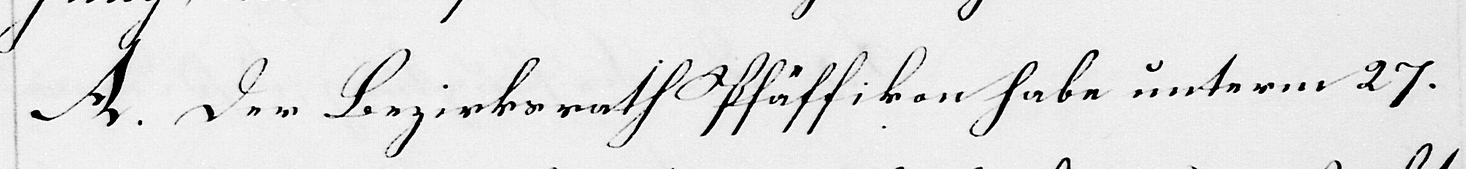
A. Der Bezirksrath Pfäffikon habe unterm 27.
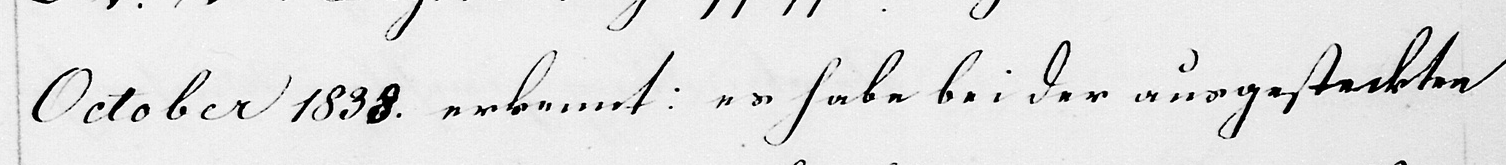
October 1838. erkennt: es habe bei der ausgesteckten
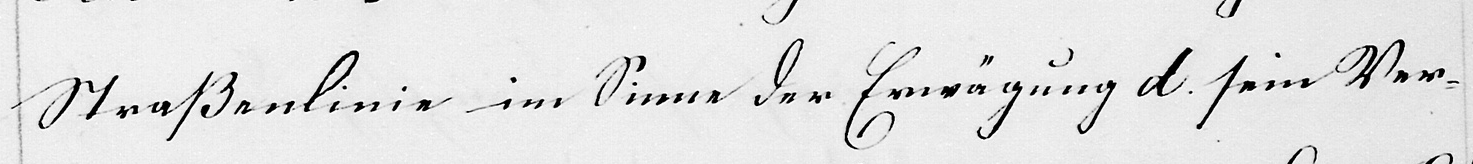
Straßenlinie im Sinne der Erwägung d. sein Ver¬
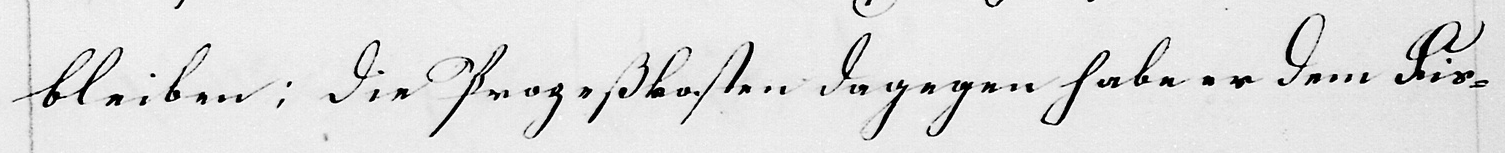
bleiben; Die Prozeßkosten dagegen habe er dem Fis¬
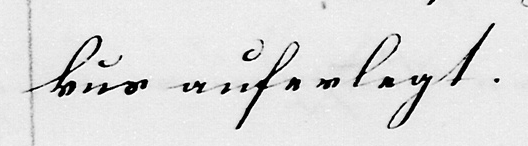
kus auferlegt.
